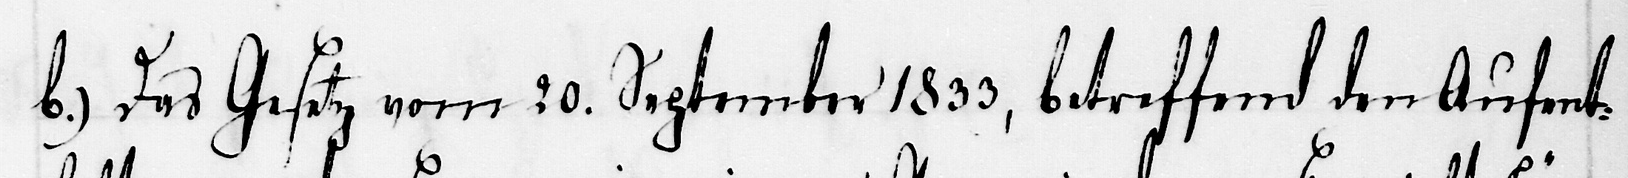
b.) Das Gesetz vom 20. September 1833, betreffend den Aufent¬
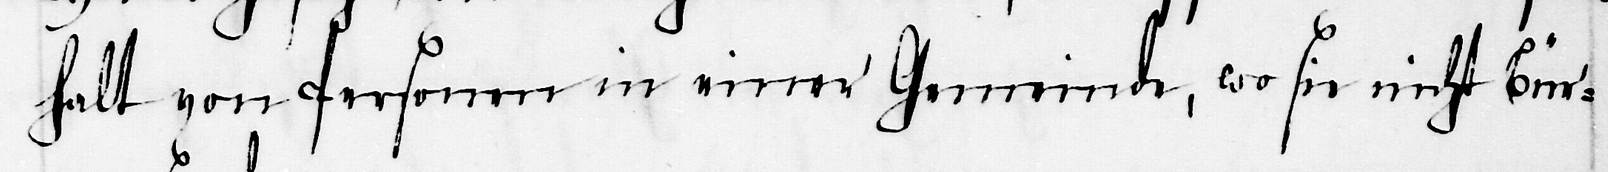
halt von Personen in einer Gemeinde, wo sie nicht Bür¬
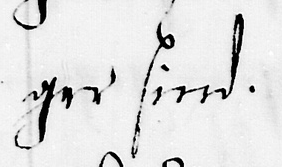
ger sind.
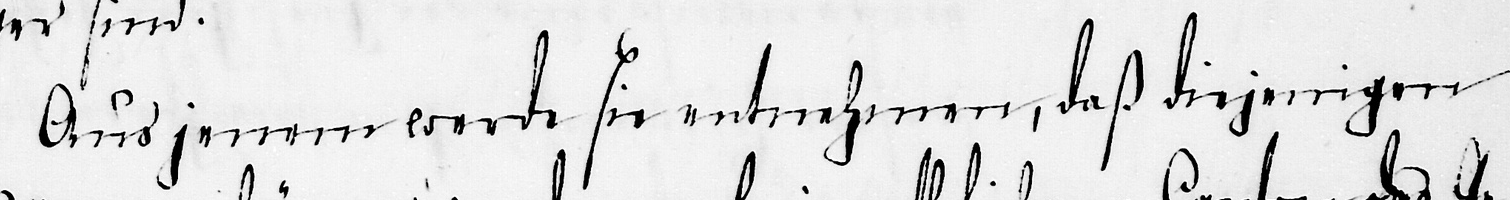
Aus jenem werde sie entnehmen, daß diejenigen
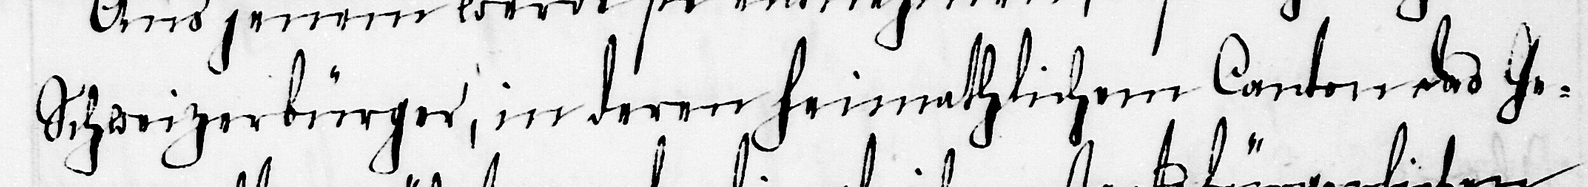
Schweizerbürger, in deren heimathlichem Canton das Ge¬
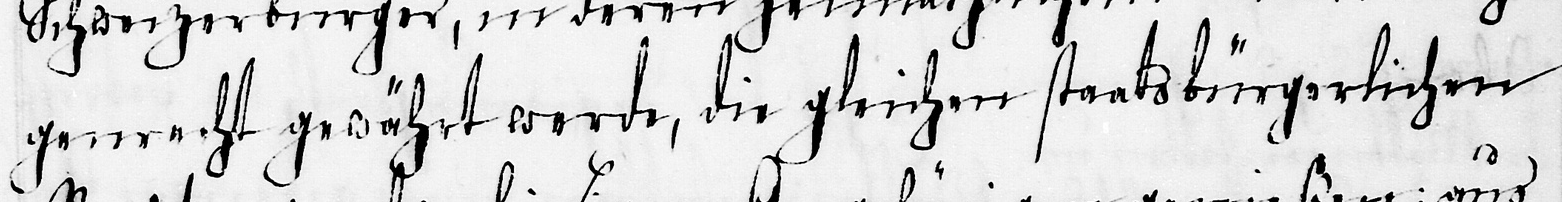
genrecht gewährt werde, die gleichen staatsbürgerlichen
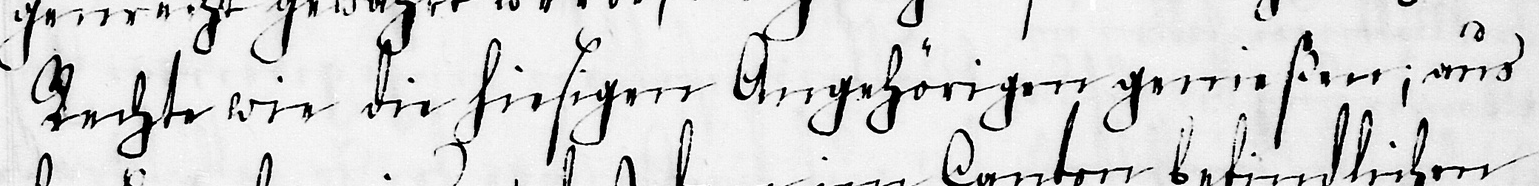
Rechte wie die hiesigen Angehörigen genießen, aus
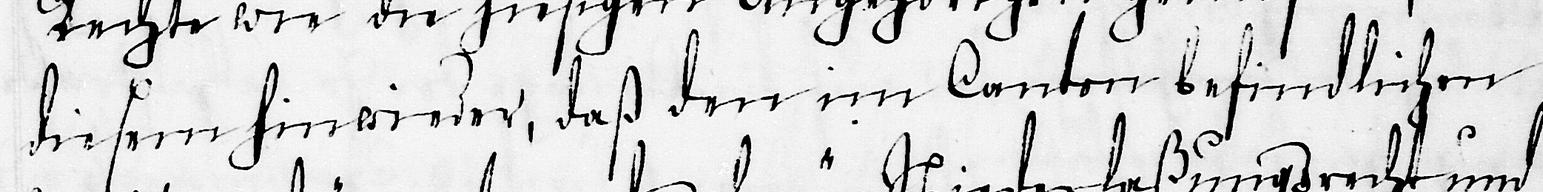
diesem hinwieder, daß den im Canton befindlichen
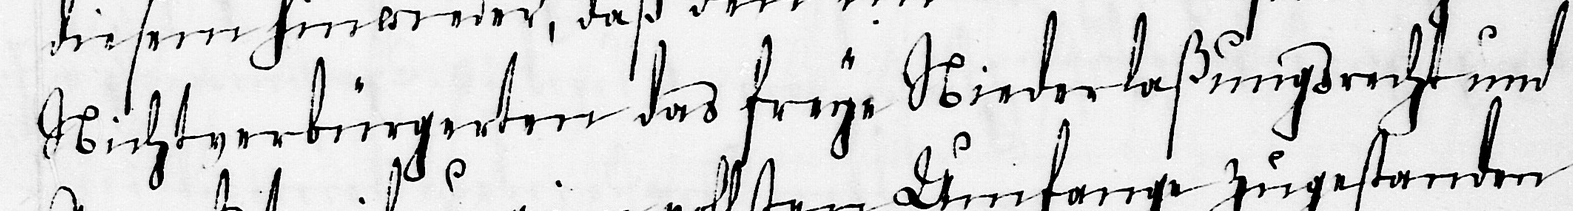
Nichtverbürgerten das freye Niederlaßungsrecht und
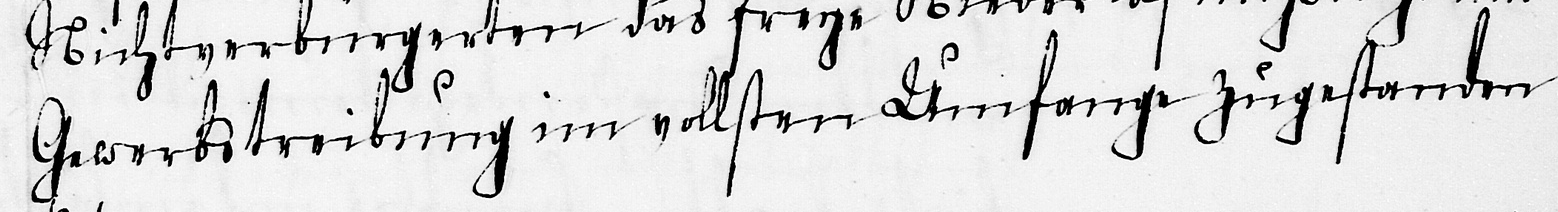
Gewerbstreibung im vollsten Umfange zugestanden
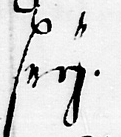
sey.
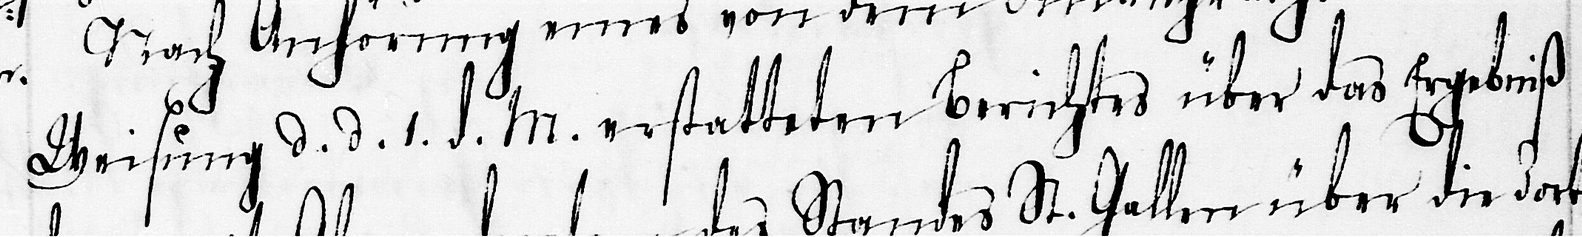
Weisung d. d. 1. d. M. erstatteten Berichtes über das Ergebniß
